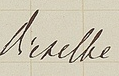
theilt
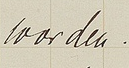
Dieselbe bestehe
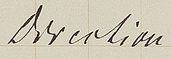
Verification
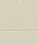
der
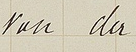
von der
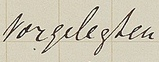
vorgelegten
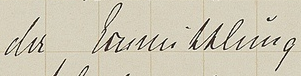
der Ermittlung
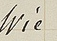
hezu
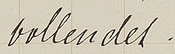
vollendet.
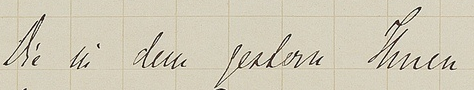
Die in dem gestern Ihnen
